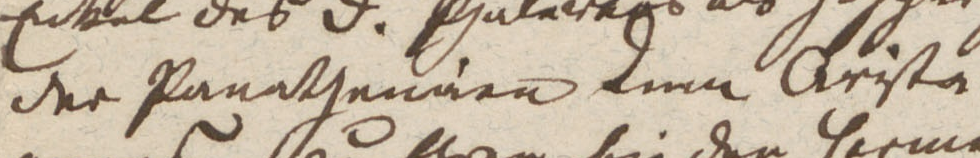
der Panathenäen de Arista-
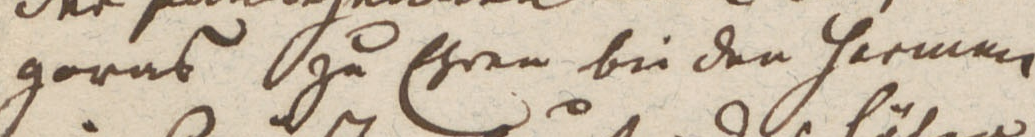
goras zu Ehren bei den Hermen
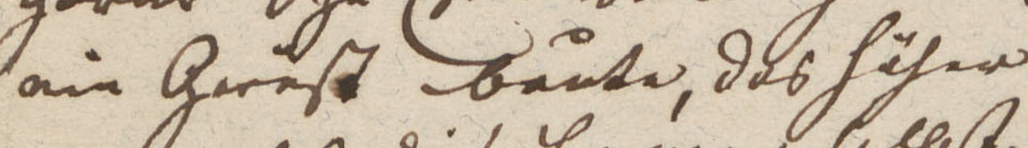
ein Gerüst baute, das höher
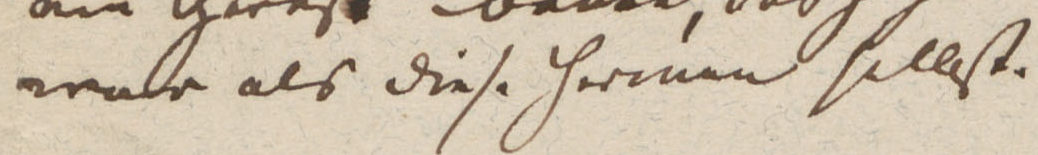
war als diese Hermen selbst.
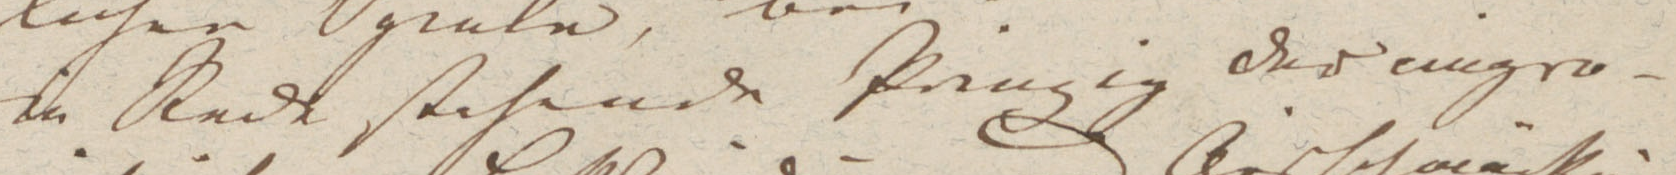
in Rede stehende Prinzip der impro-
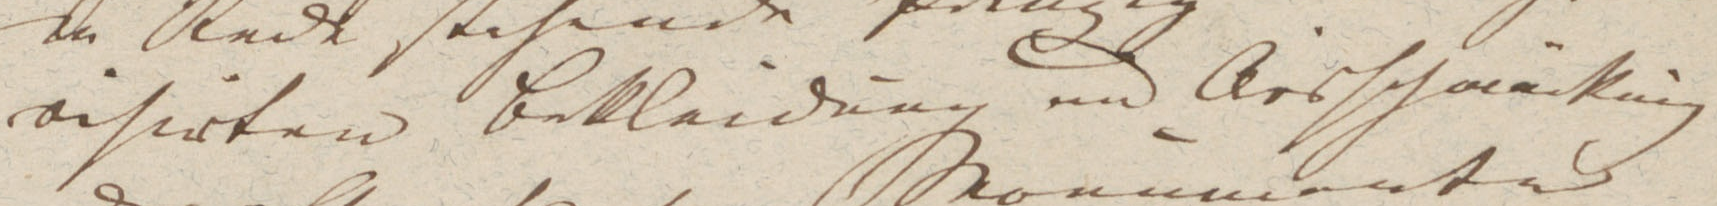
visirten Bekleidung und Ausschmückung
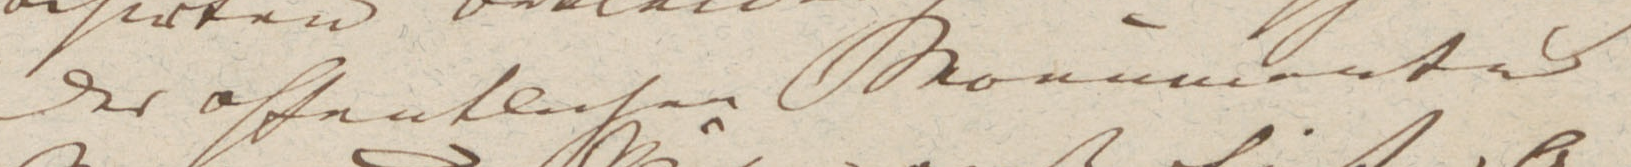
der offentlichen Monumente
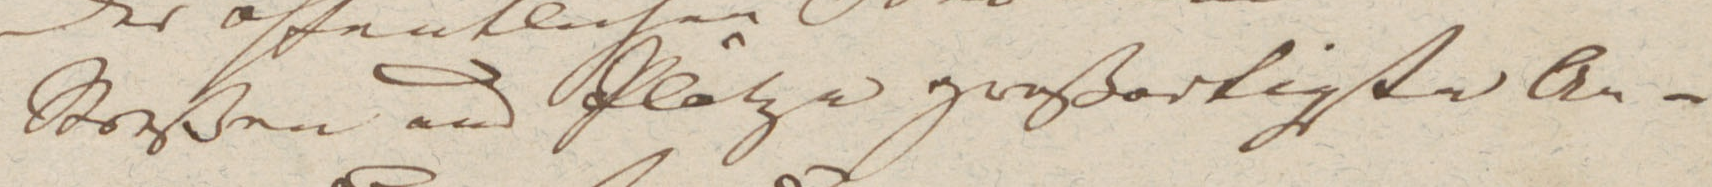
Strassen und Plätze grossartgste An-
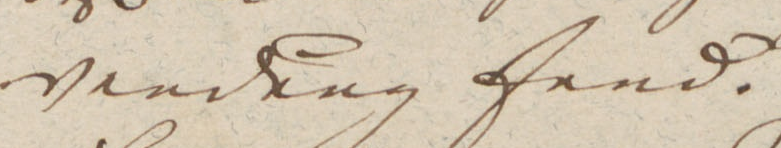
wendung fand.
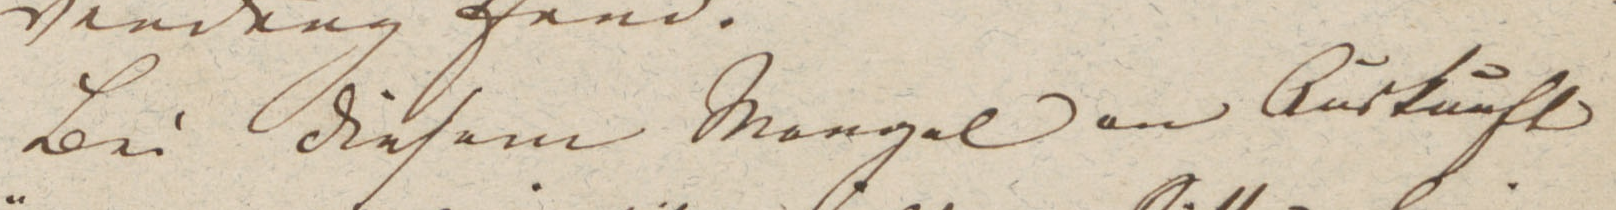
Bei diesem Mangel an Auskunft
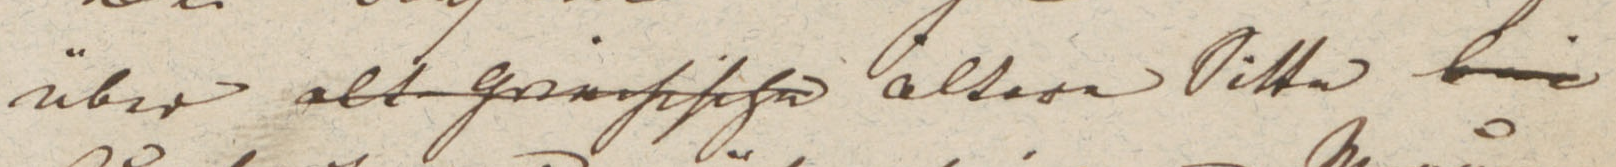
über alt-griechische ältere Sitte bei
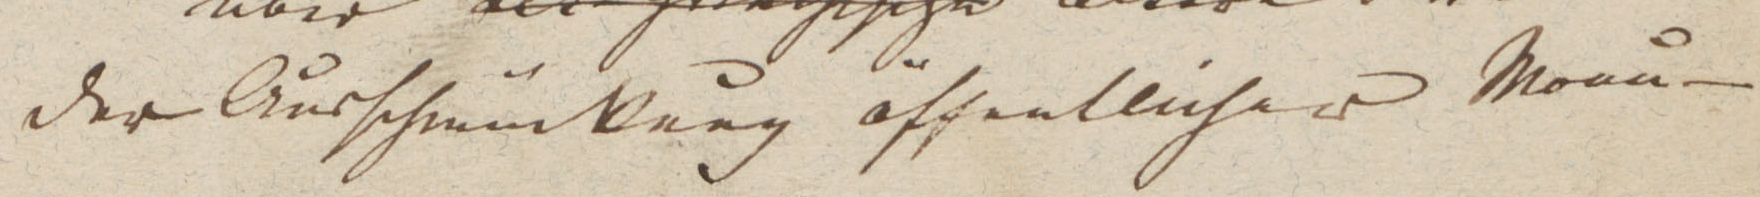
der Ausschmückung öffentlicher Monu-
